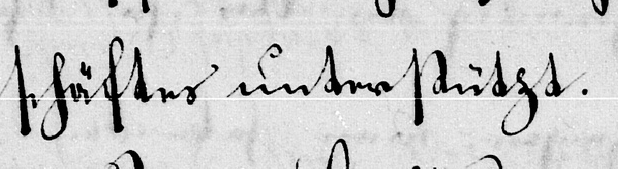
schäftes unterstützt.
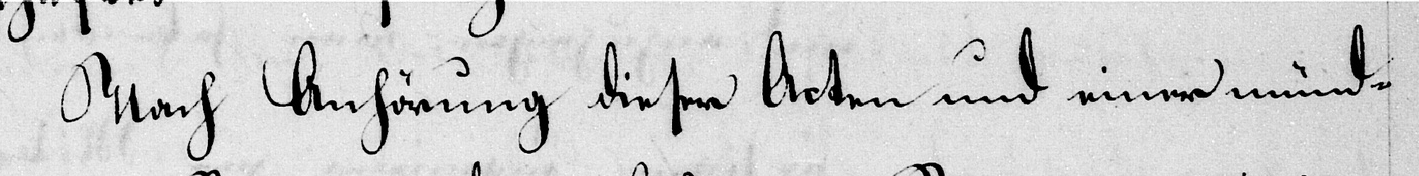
Nach Anhörung dieser Acten und einer münd¬
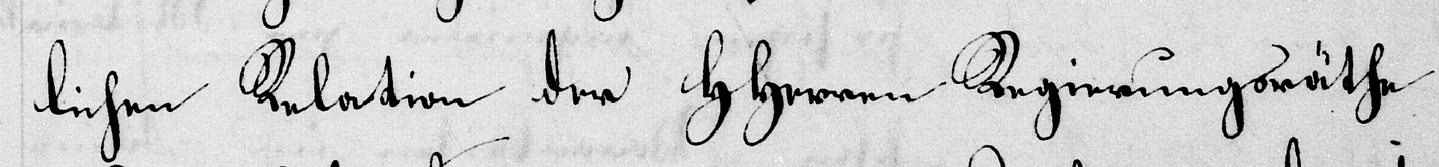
lichen Relation der HHerren Regierungsräthe
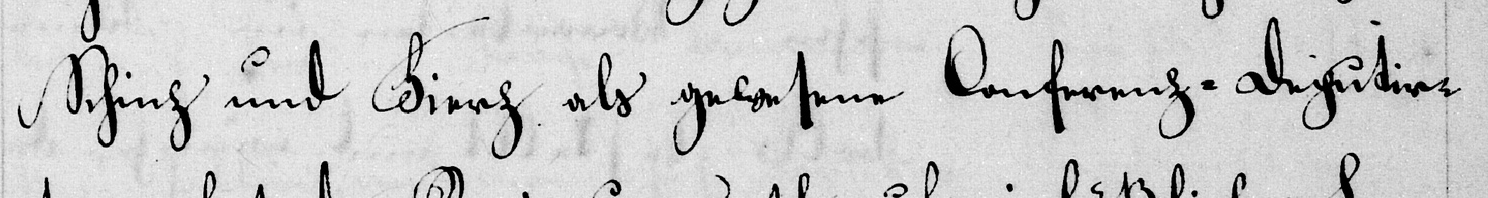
Schinz und Fierz als gewesene Conferenz-Deputir¬
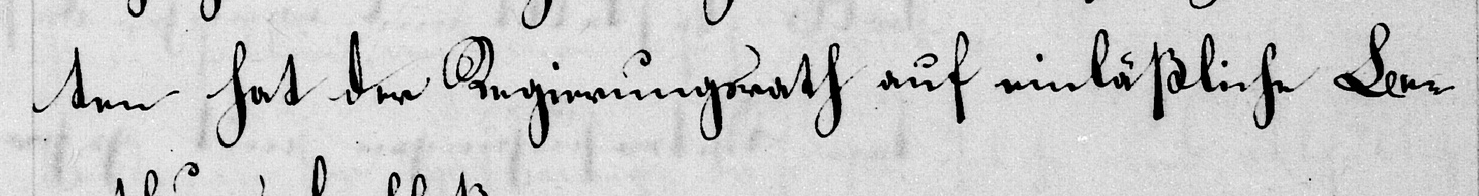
ten hat der Regierungsrath auf einläßliche Be¬
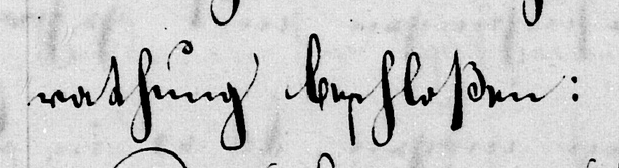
rathung beschloßen:
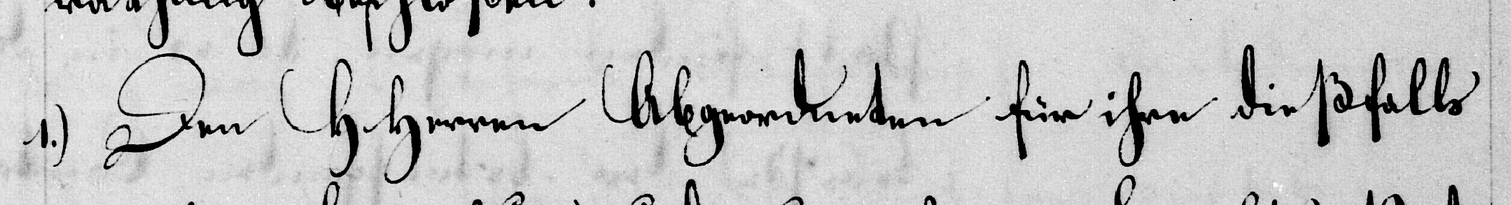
1.) Den HHerren Abgeordneten für ihre dießfalls
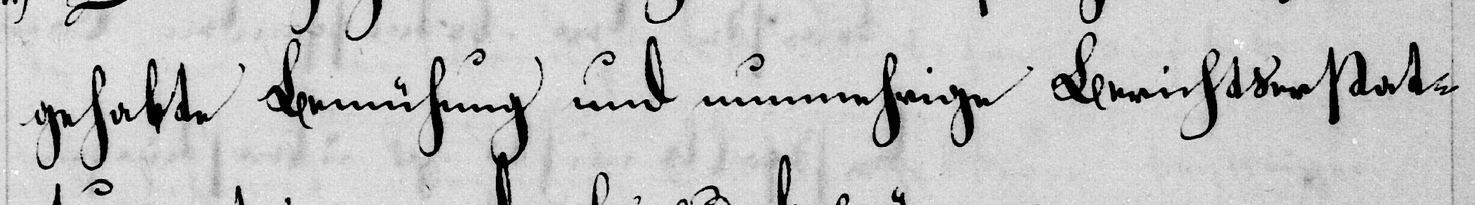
gehabte Bemühung und nunmehrige Berichterstat¬
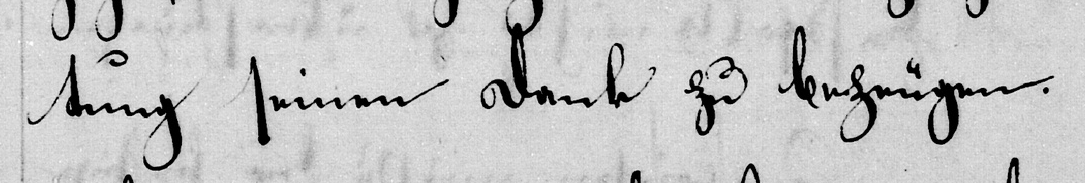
tung seinen Dank zu bezeugen.
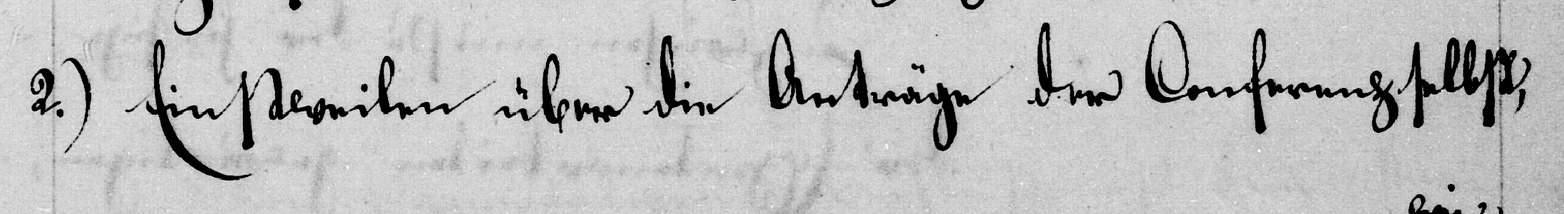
2.) Einstweilen über die Anträge der Conferenz selbst,
